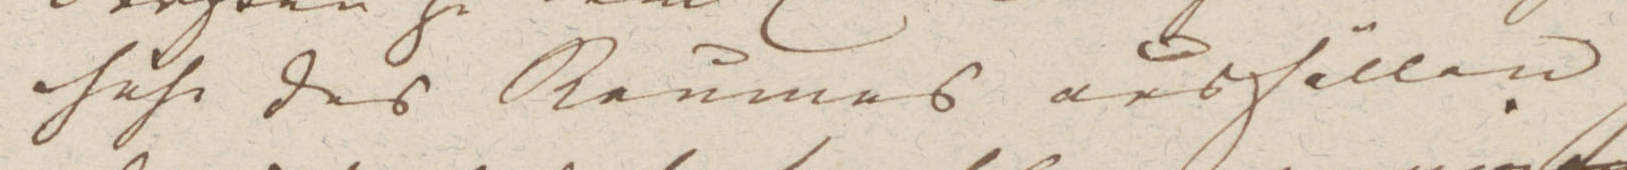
Höhe des Raumes ausfüllen,
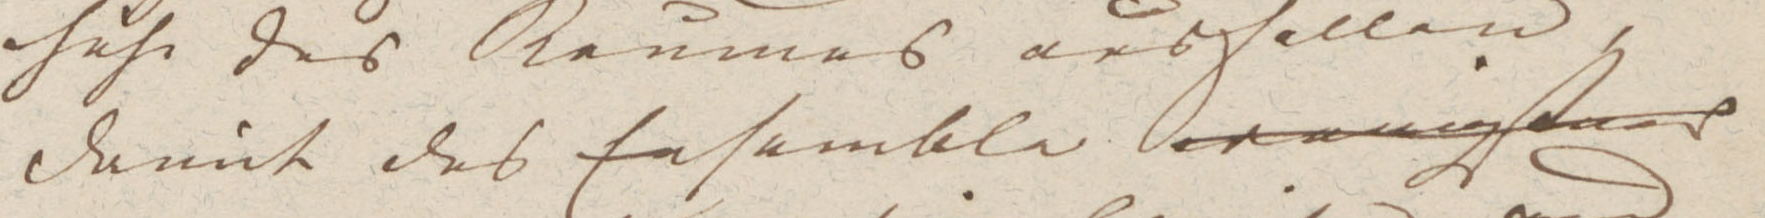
damit das Ensemble wenigstens
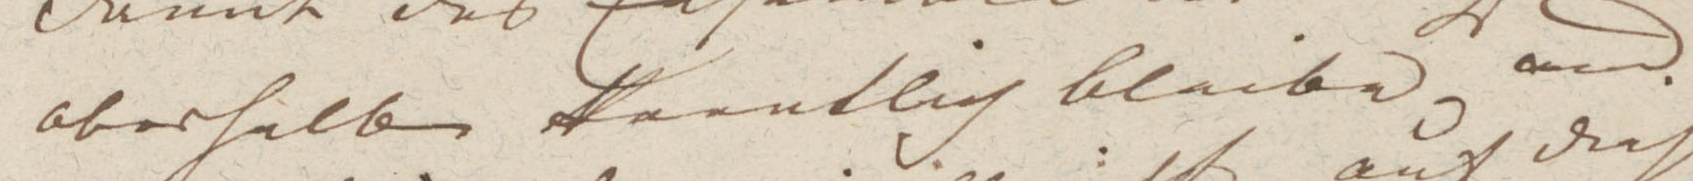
oberhalb kenntlich bleibe und
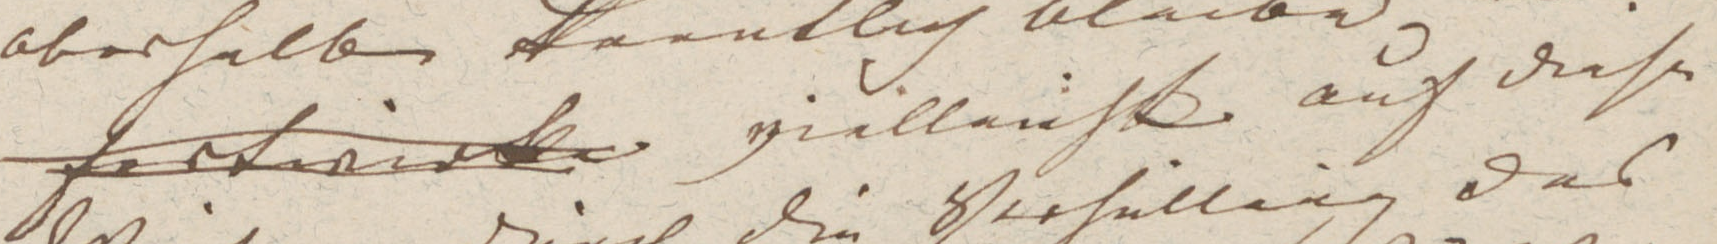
fortwirke vielleicht auf diese
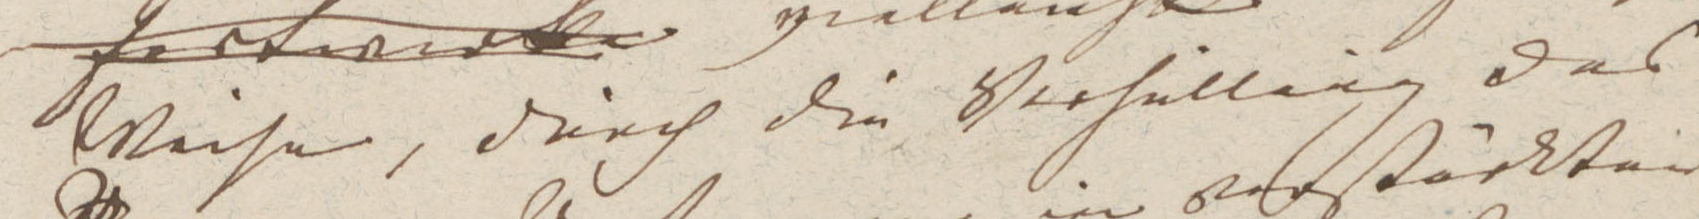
Weise, durch die Verhüllung des
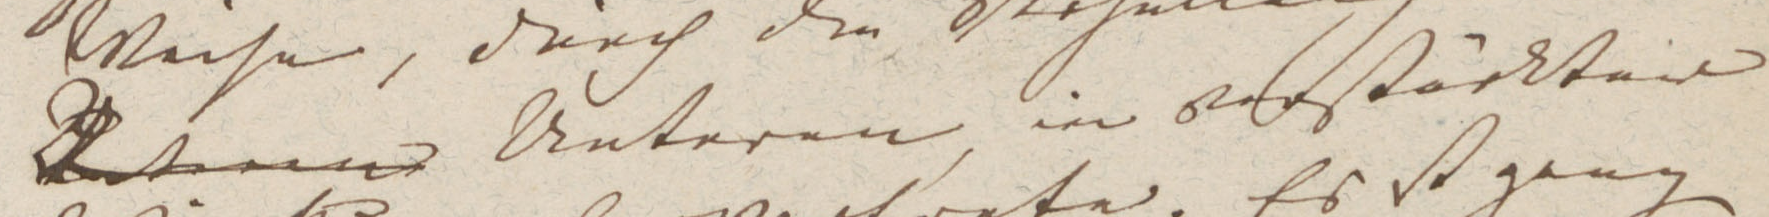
Unteren Unteren, in verstärkter
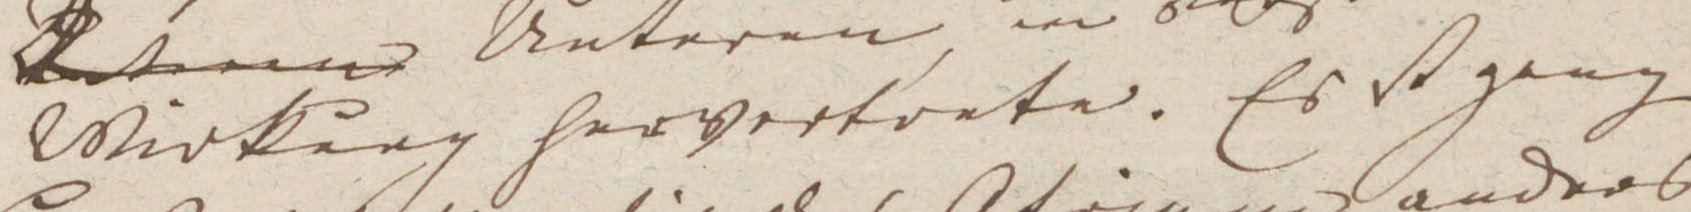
Wirkung hervortrete. Es ist ganz
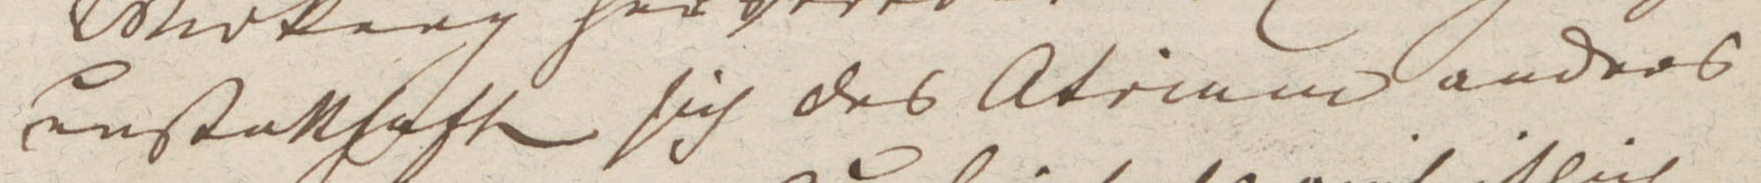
unstatthaft sich das Atrium anders
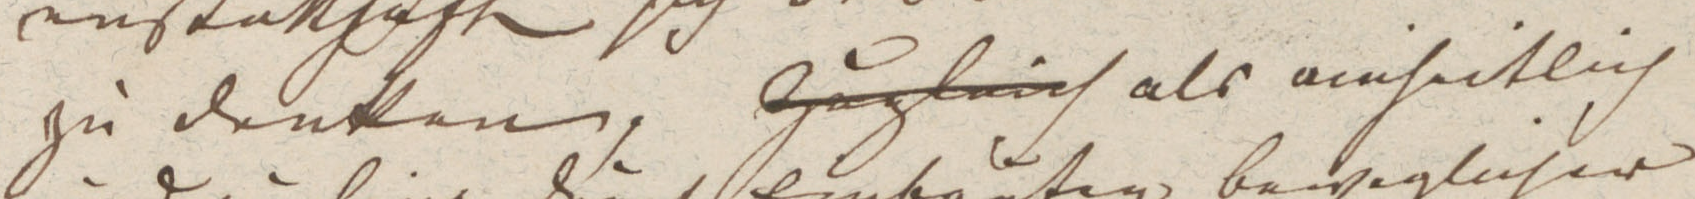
zu denken, Zugleich als einheitlich
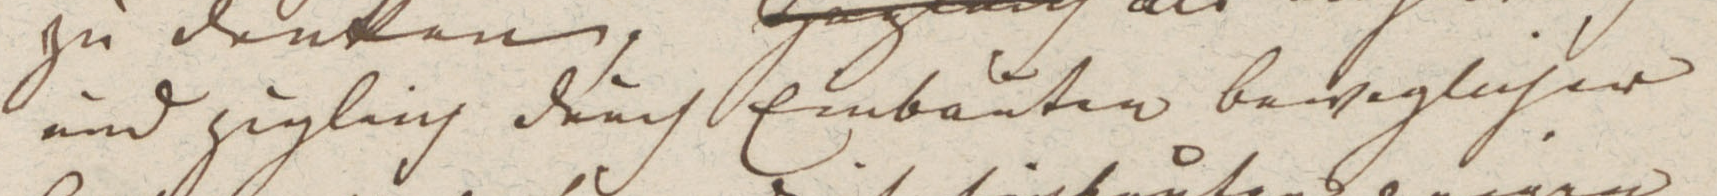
und zugleich durch Einbauten beweglicher
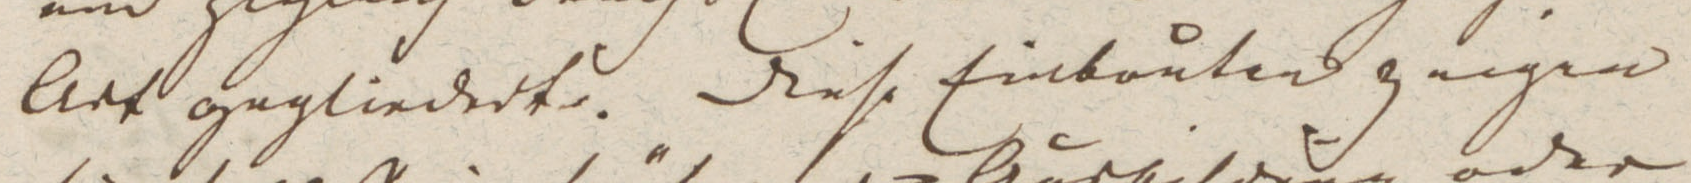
Art gegliedert. Diese Einbauten zeigen
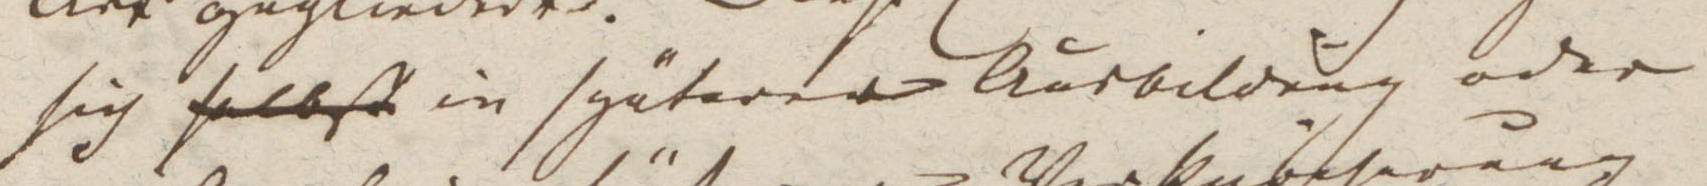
sich selbst in späterer Ausbildung oder
